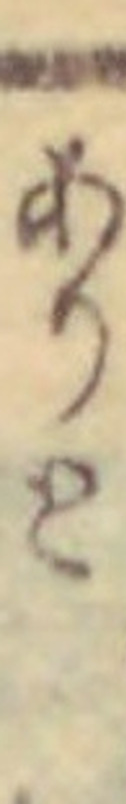ありと
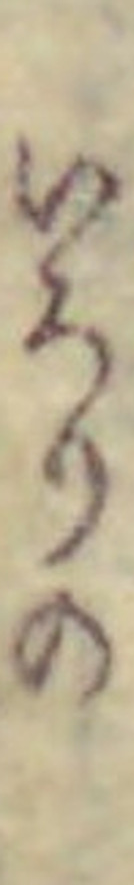いろりの
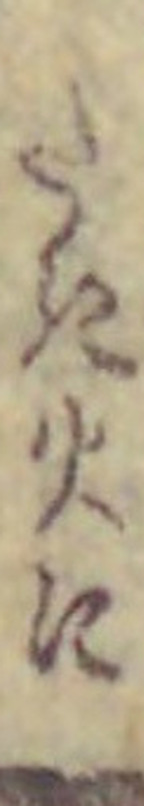たき火に
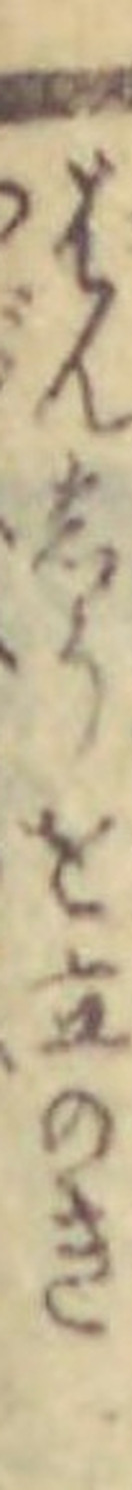ばんしうを立のき
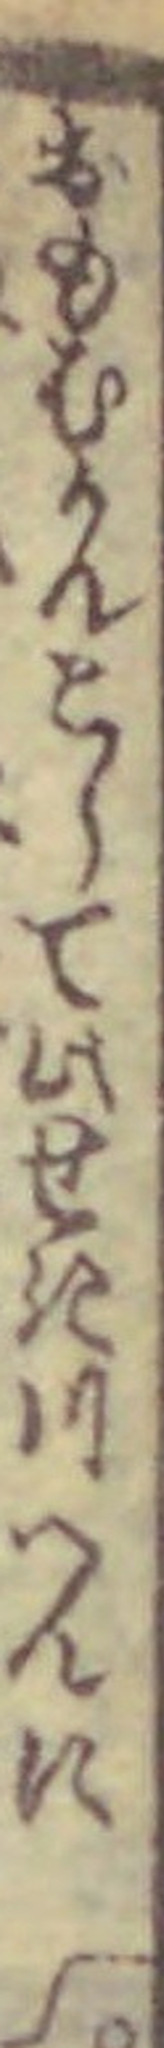おもむかんとして此せき川へんに
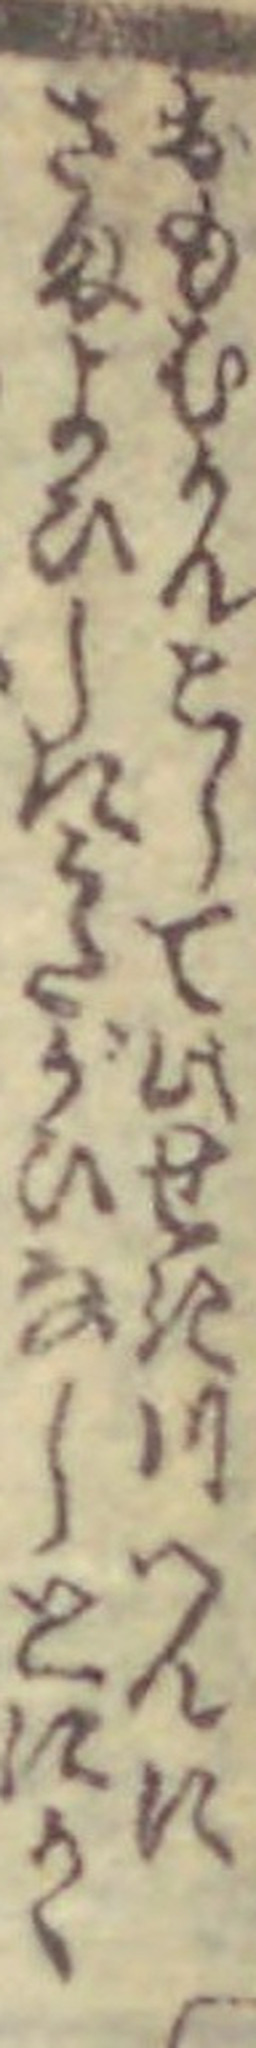さまよひしにうたがひなしとにかく
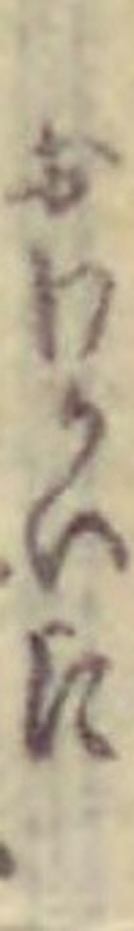おわかいに
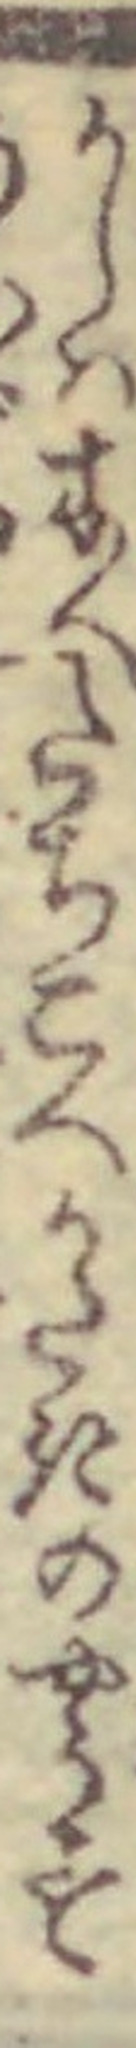かしは木へたちこへかたきのやうす
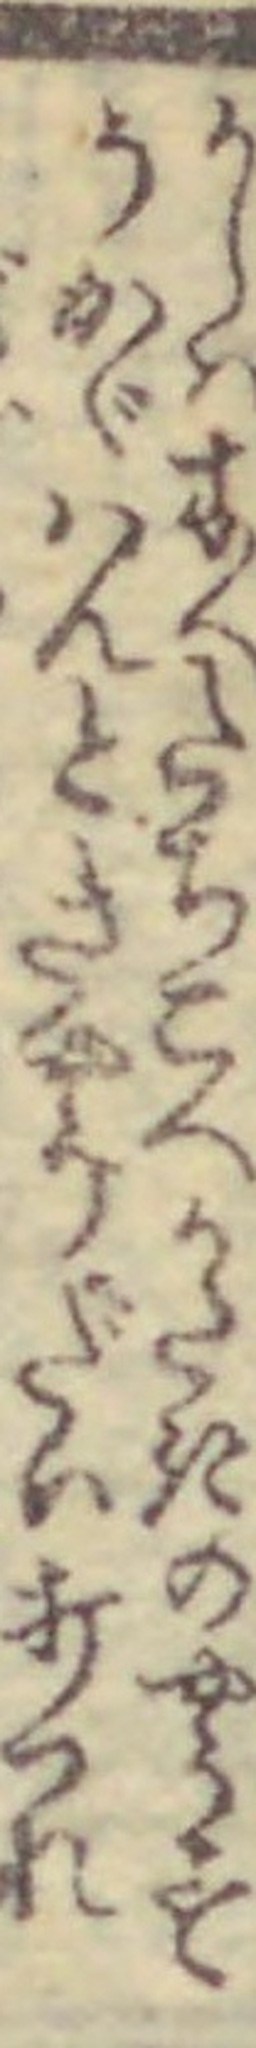うかゞはんときやうだいは打つれ
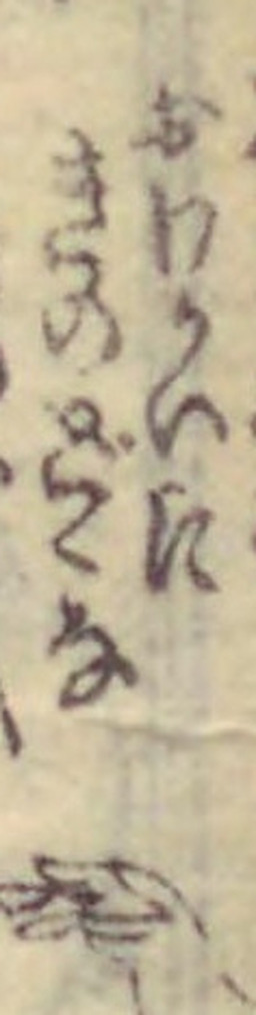きのどくな
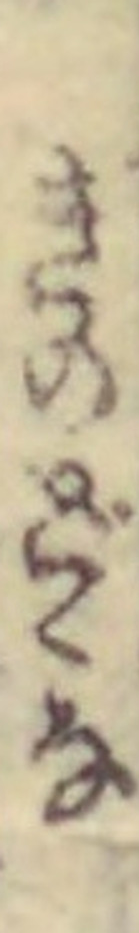きのどくな
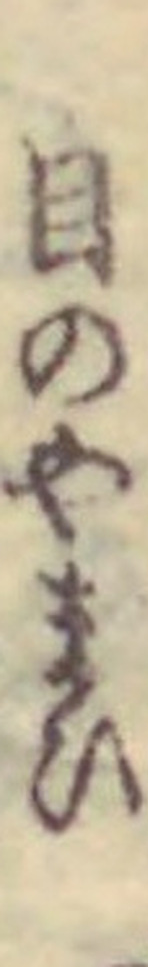目のやまひ
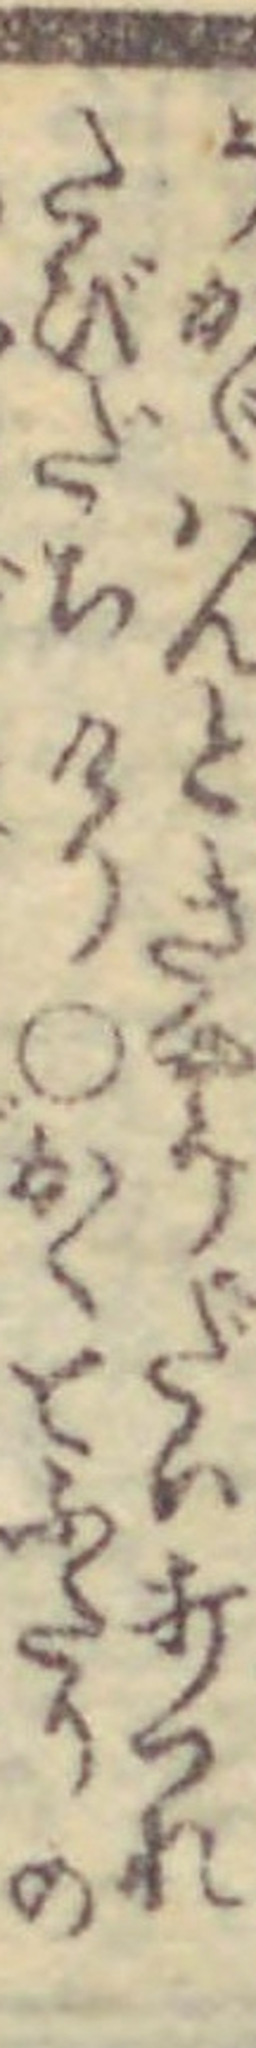たびだちけり○かくてふたりの
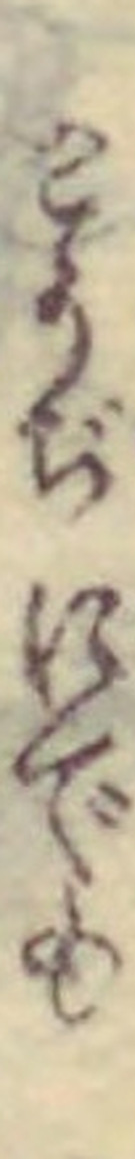とうぢにでも
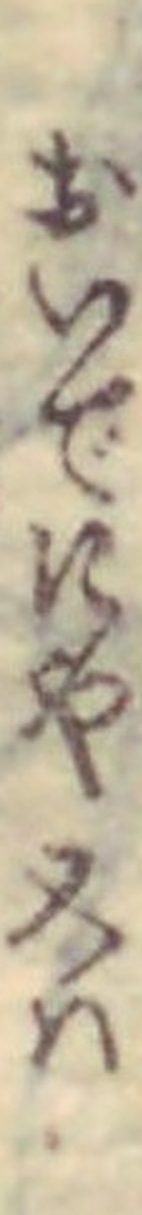おいでにや又は
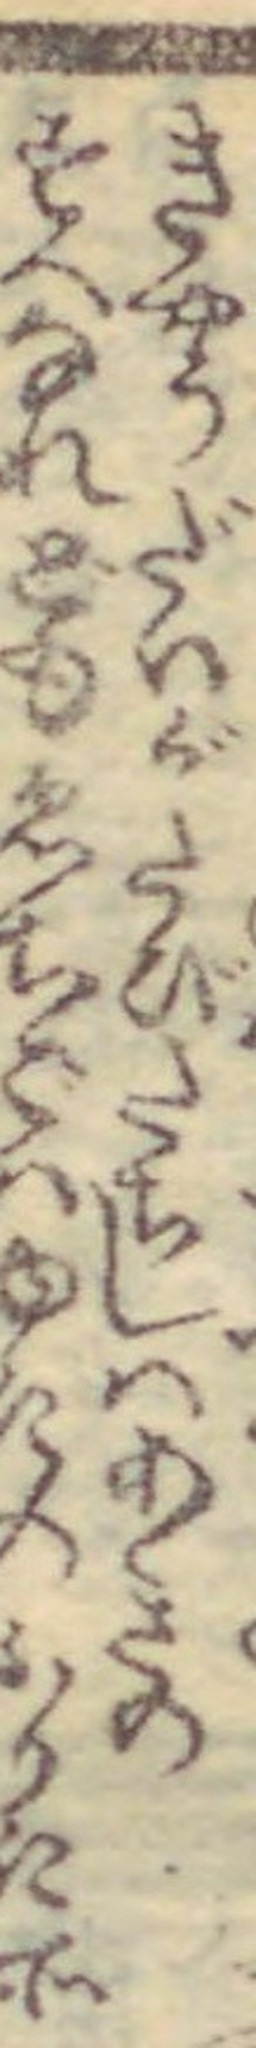すへなれどもゑちごはゆきのふりき所
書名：八ツ目鱣因縁物語 3巻
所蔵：国立国会図書館 National Diet Library, JAPAN
